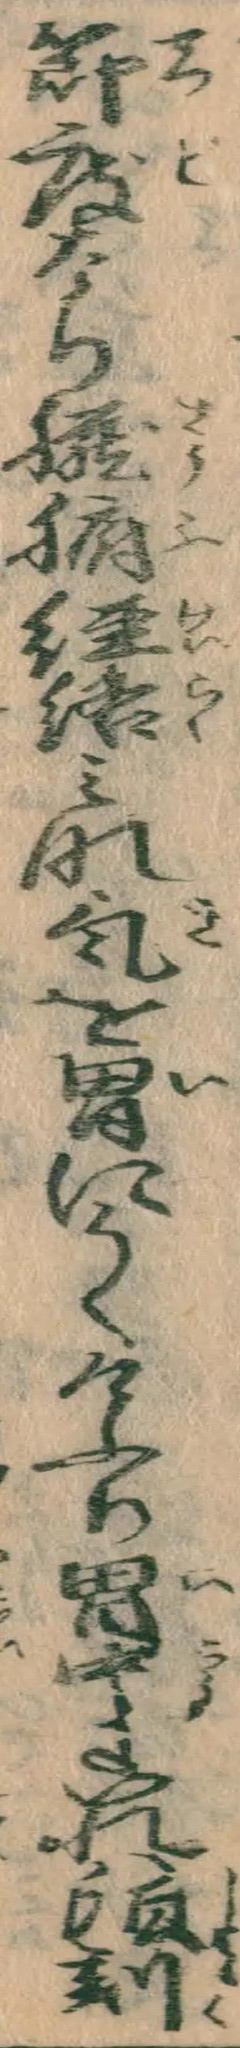節度なり臓腑経絡みな気を胃にうくけふり胃中にいれは頃刻
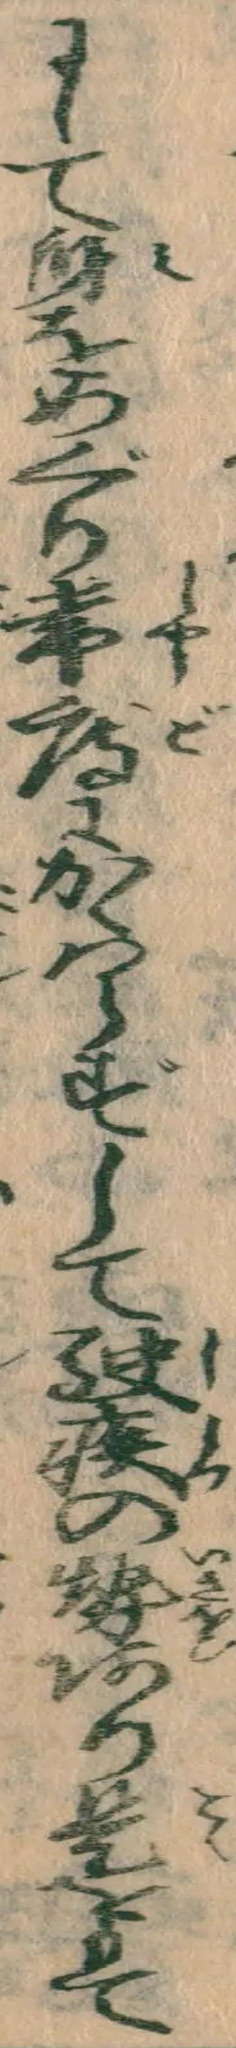にして身をめぐり常度にかゝはらずして駛疾の勢あり是をもて
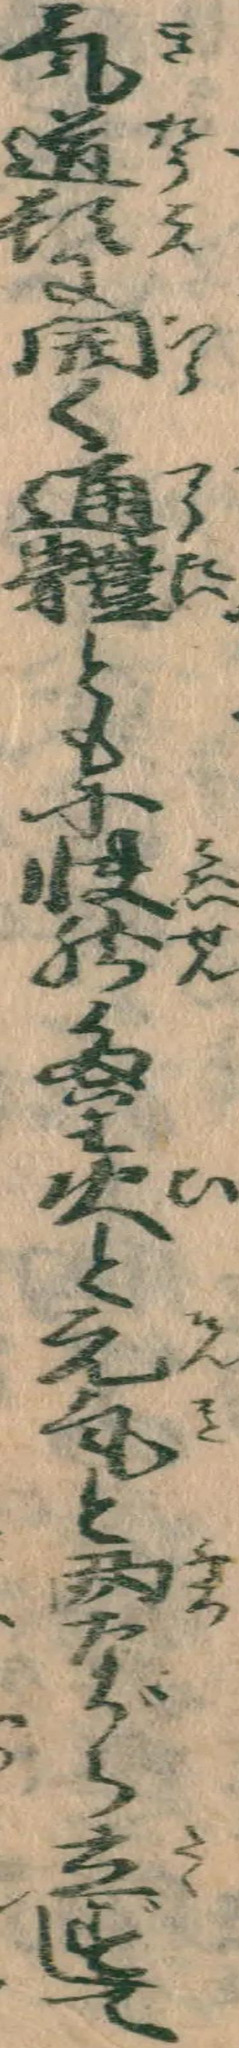気道頓に開く通体ともに快然たり火と元気と両ながら立ずして
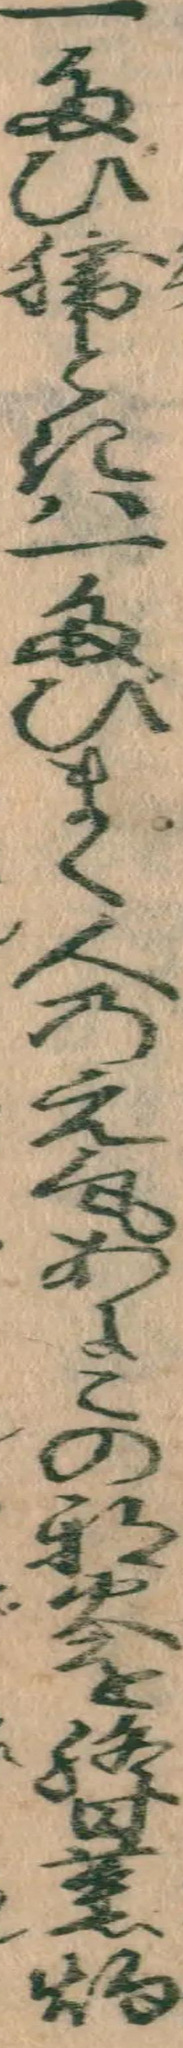一たび勝ときは一たびまく人の元気あにこの邪火を終日薫灼
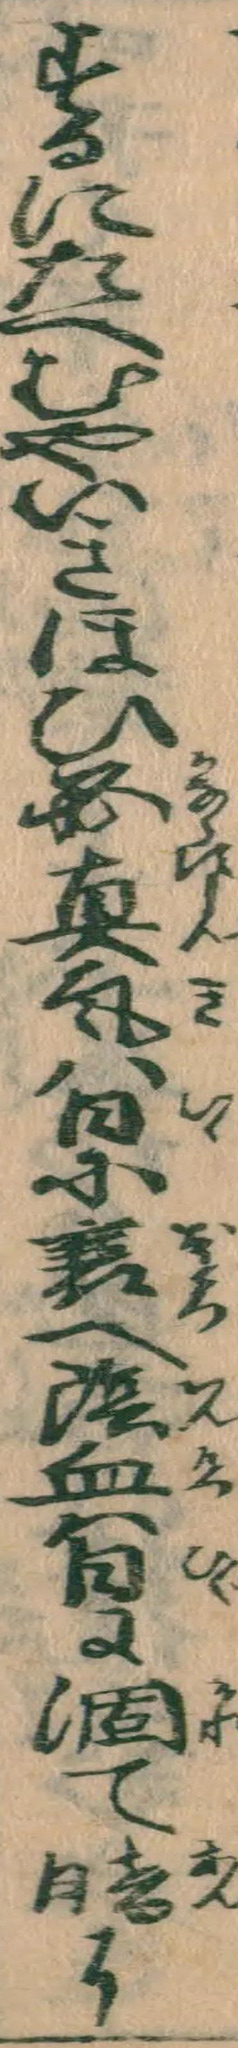するにたへむやいきほひ必真気は日に衰へ陰血は日に涸て暗に
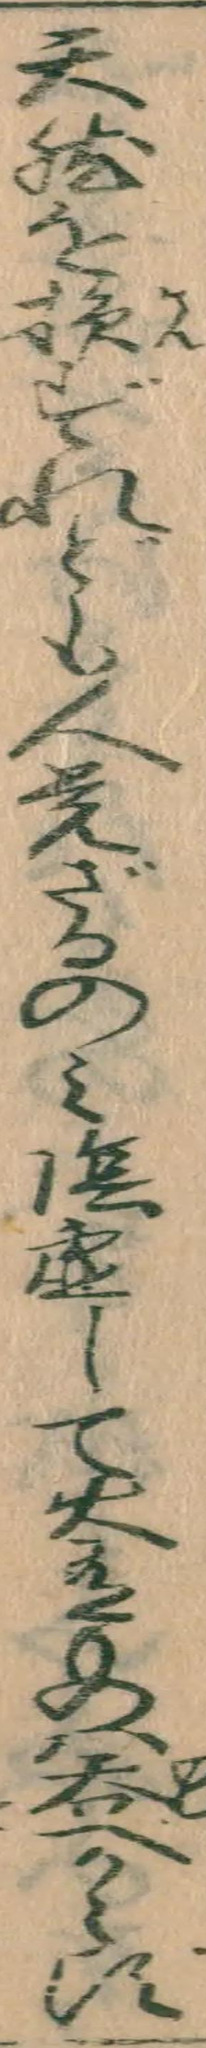天然を損ずれども人覚ざるのみ陰虚して火有ものは呑へからず
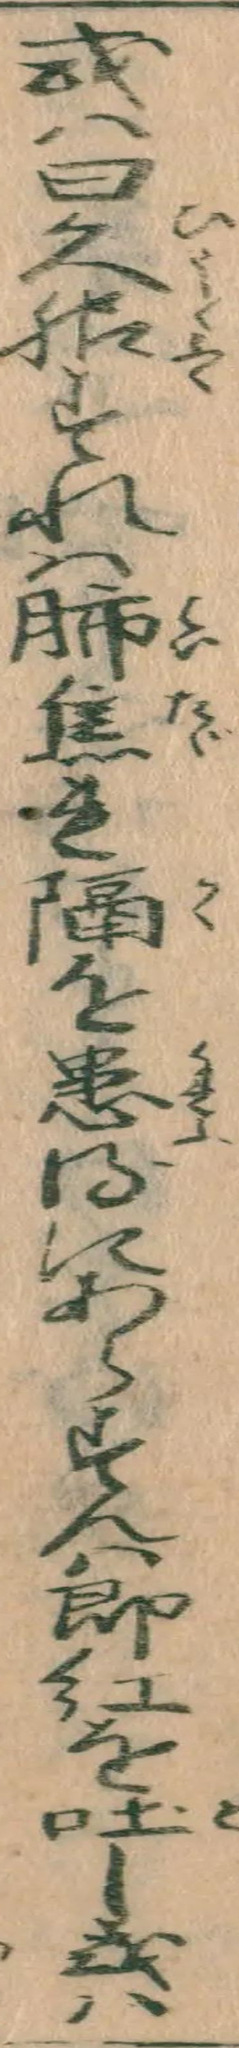或は曰久服すれは肺焦れ隔を患るにあらすんは即紅を吐し或は
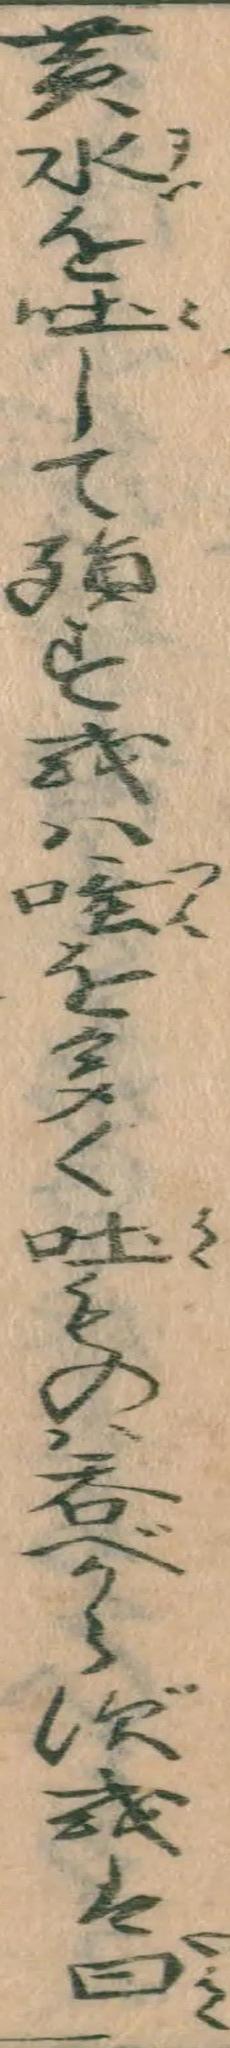黄水を吐して殤す或は唾を多く吐ものは呑べからず或は曰
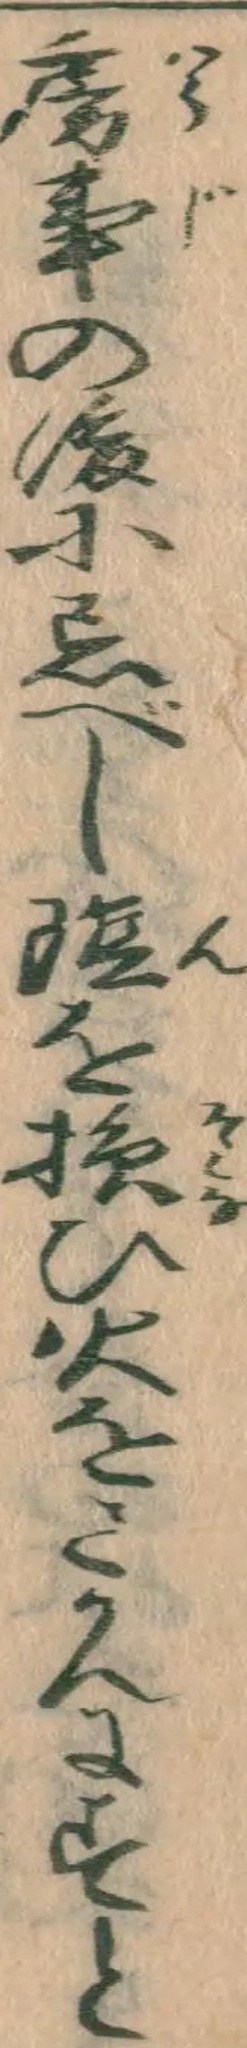房事の後に忌べし陰を損ひ火をさかんにすと
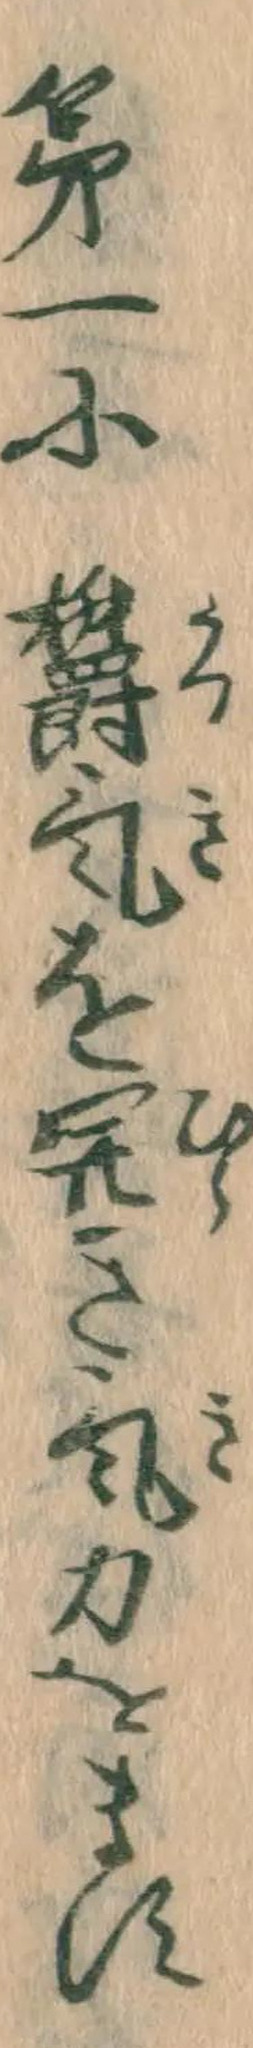第一に鬱気を開き気力をます
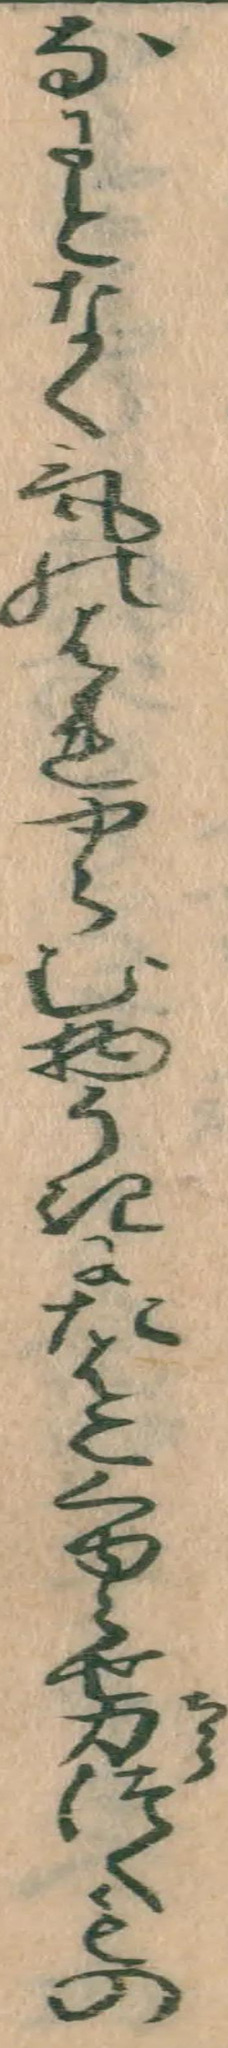なにとなく気のはれやらむ物うきにたはこくゆらせ力つくもの
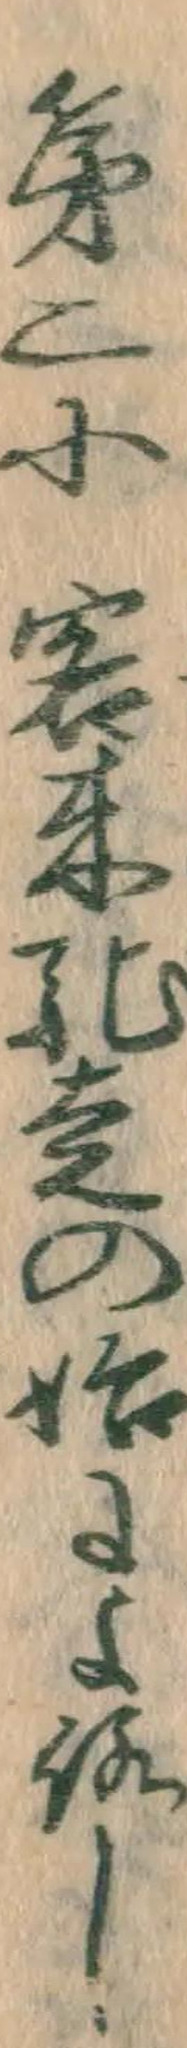第二に客来馳走の始によろし
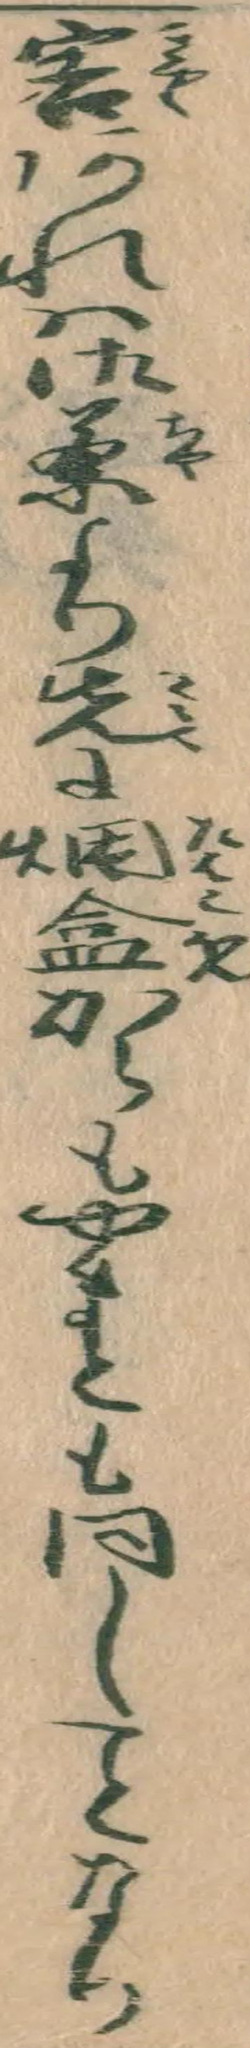客あれは御茶より先に烟盆からもやまとも同しことなり
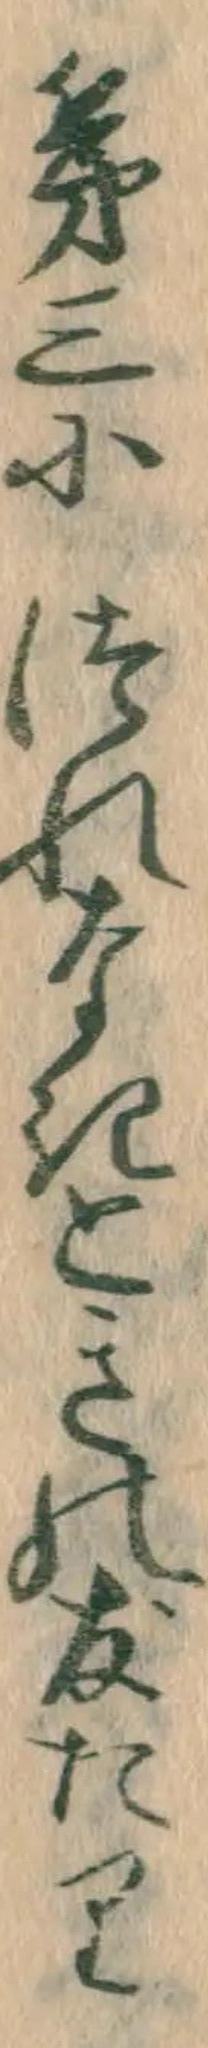第三につれなきときの友たり
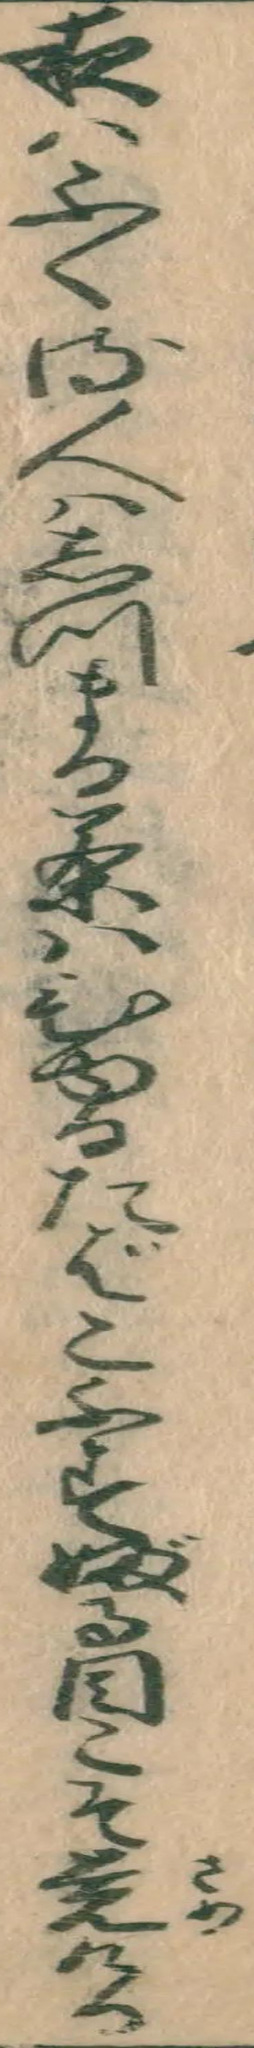夜はふくる人はしつまる茶はひゆるたばこふすぶる目こそ覚ける
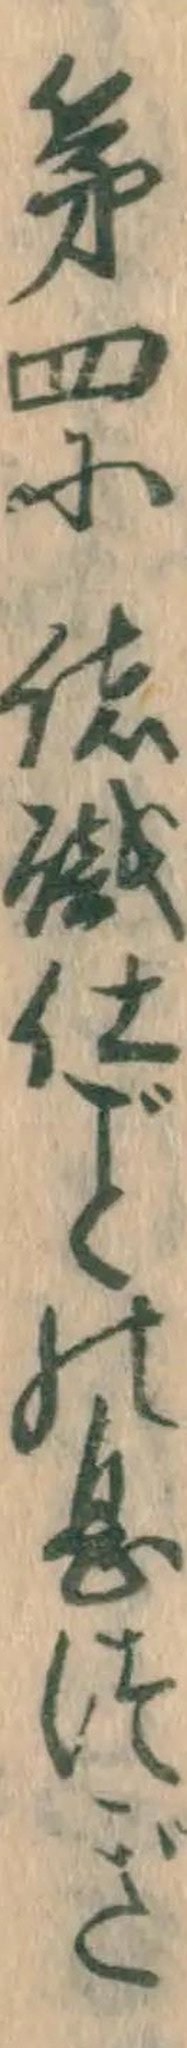第四に諸職仕ごとの息つぎ
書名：煙草記
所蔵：国立国会図書館 National Diet Library, JAPAN
